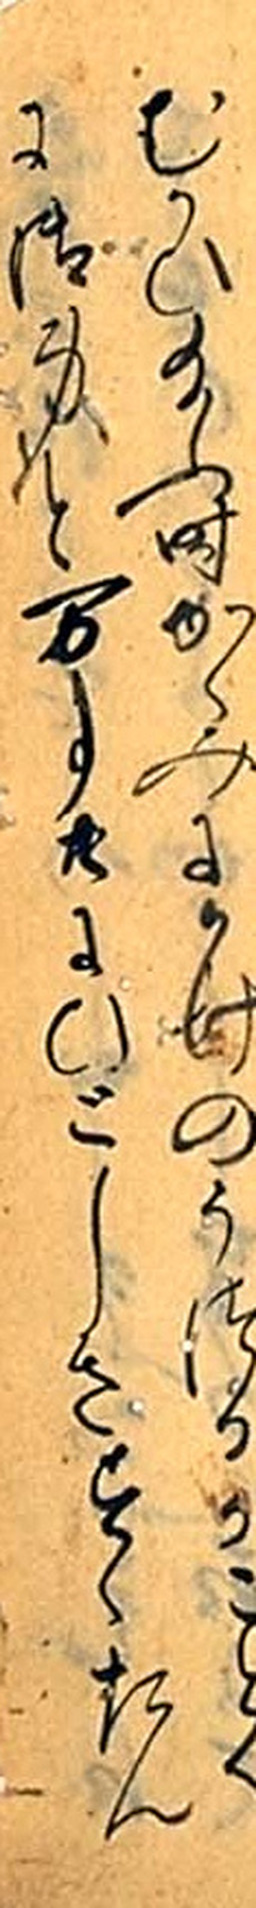に御身と万事共にひとしきすゝたん

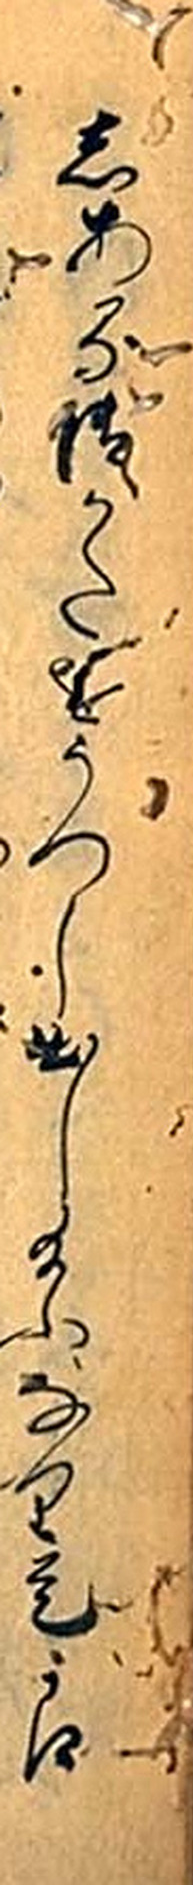しある御かたをうつし出し給ふなり是即
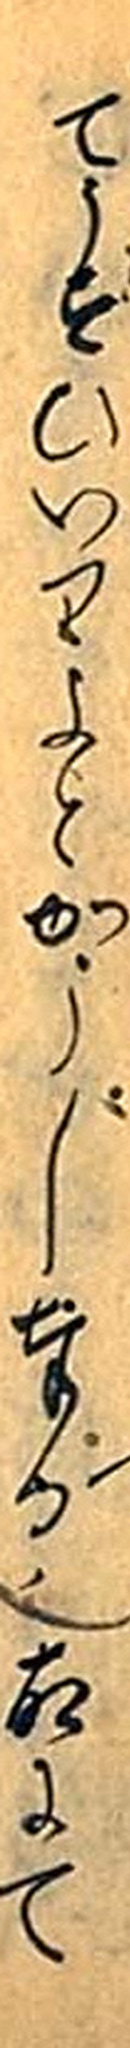てうすひいりよとかうし奉る也故にて
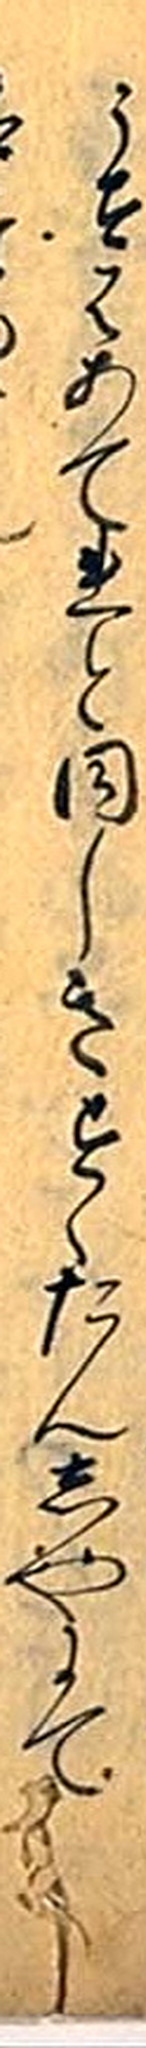うすはあてれと同しきすゝたんしやにて
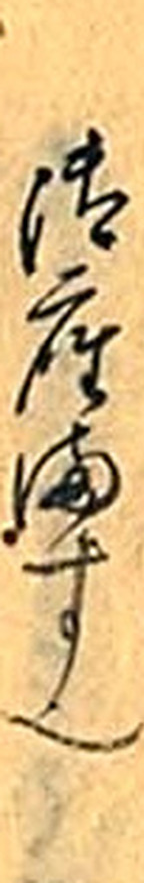御座ます也
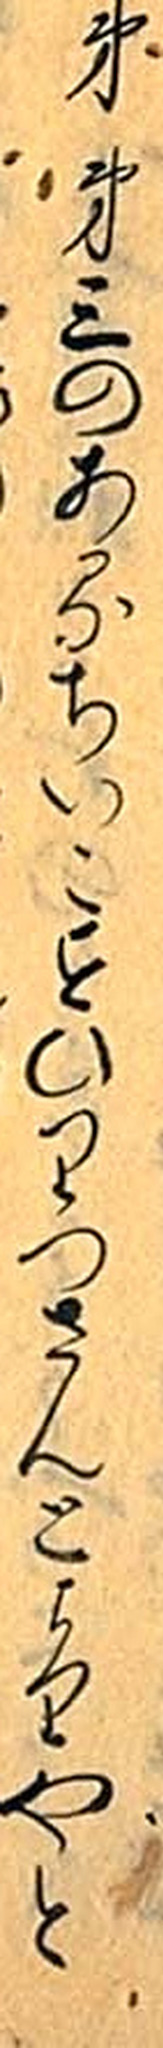弟第三のあるちいこすひりつさんとよりやと
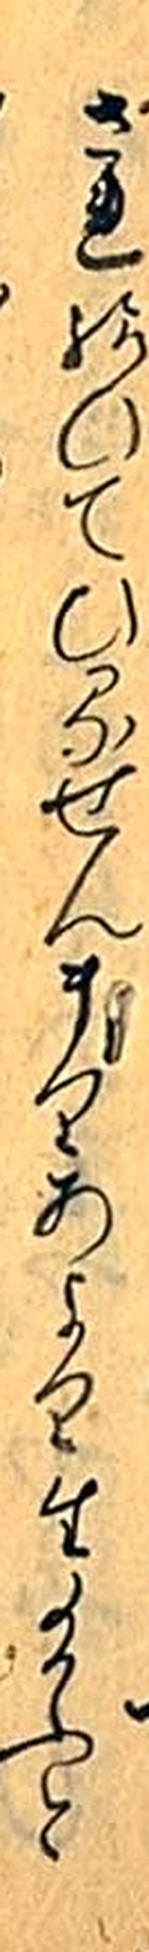され給ひてひるせんまりあより生給ふと
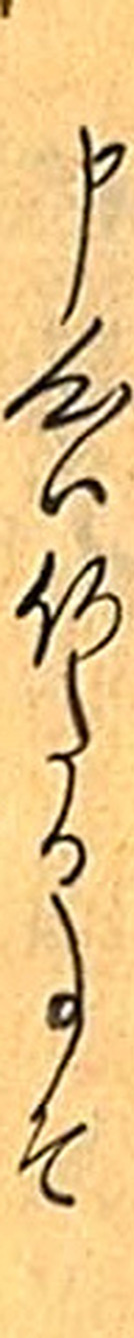申心は何たる事そ
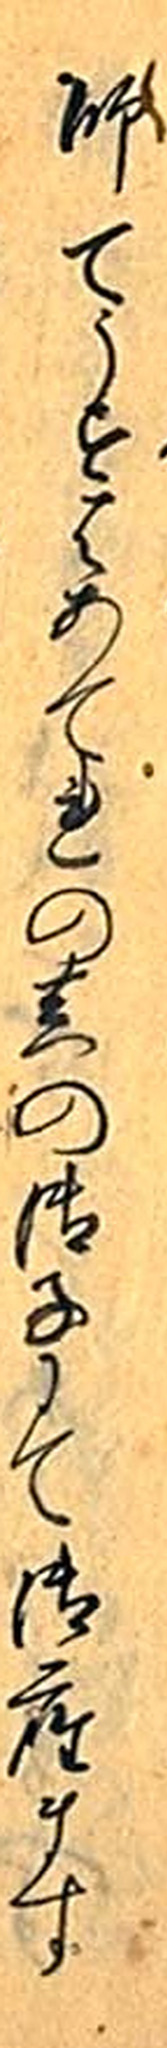師てうすはあてれの真の御子にて御座ます
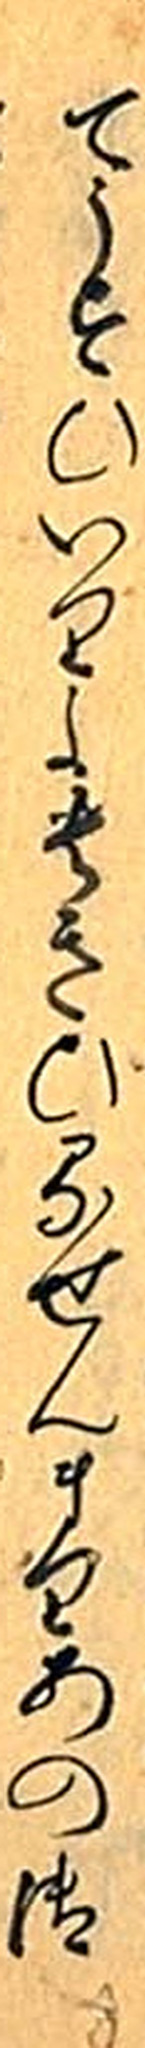てうすひいりよ貴きひるせんまりあの御
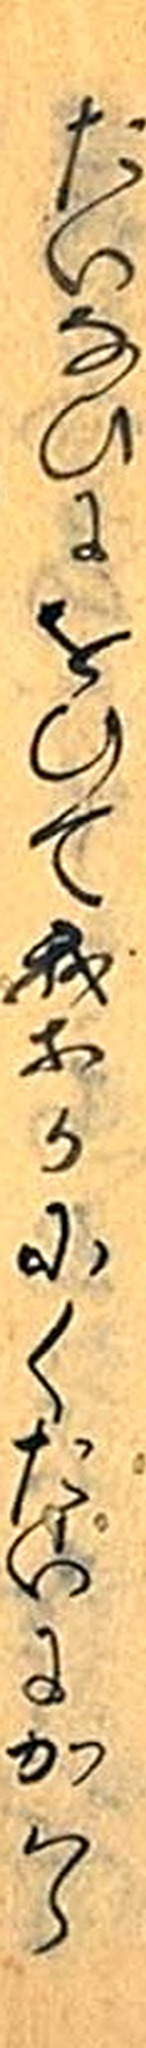たいなひにをひて我等かにくたいにかはら
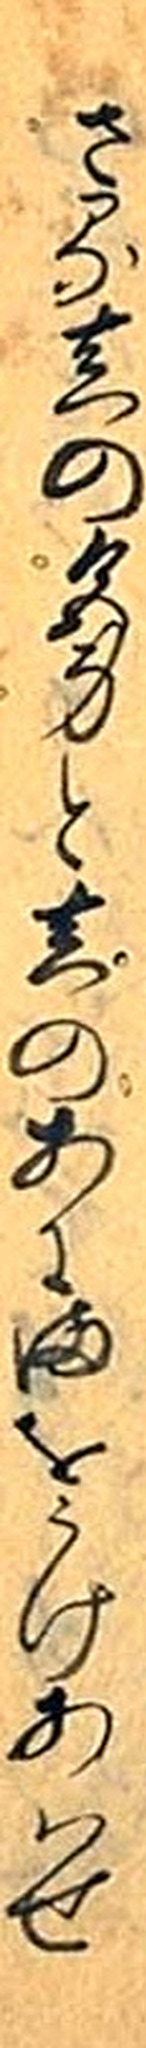さる真の色身と真のあにまをうけあはせ
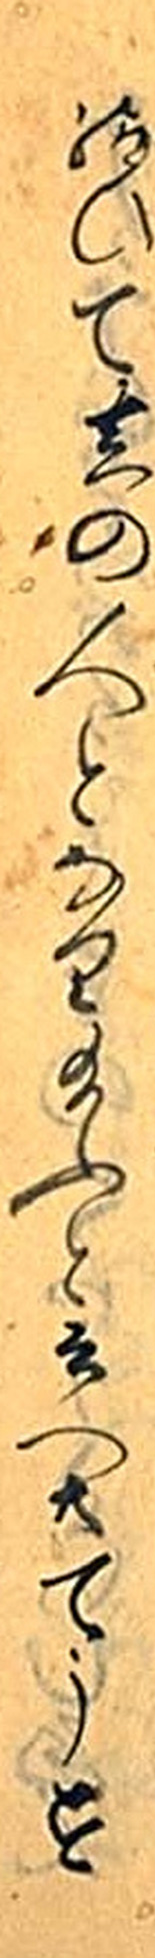給ひて真の人となり給ふと云へ共てうす
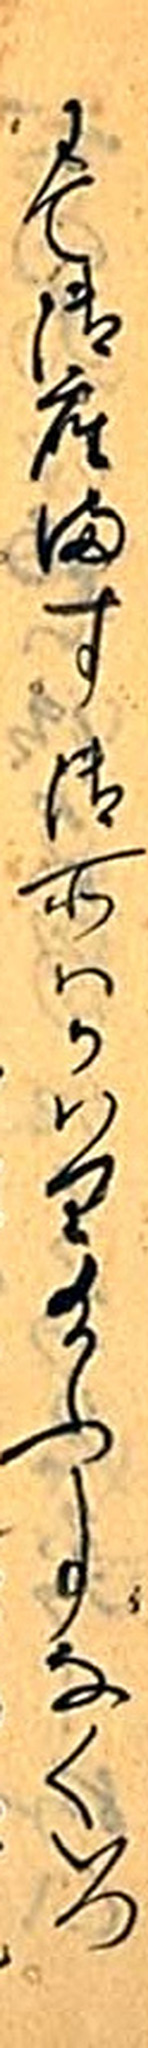にて御座ます御所はかはり給ふ事なくいつ
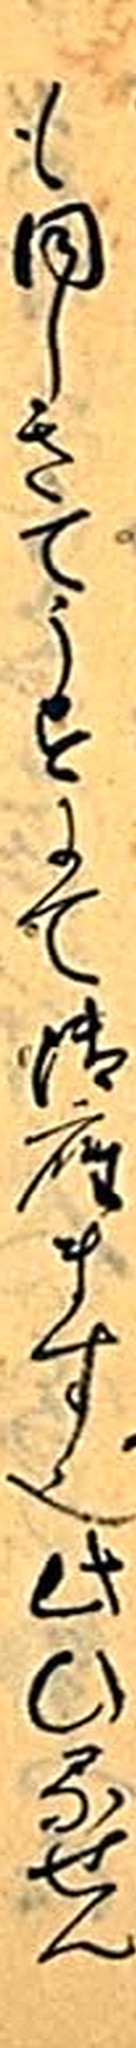も同しきてうすにて御座ます也此ひるせん
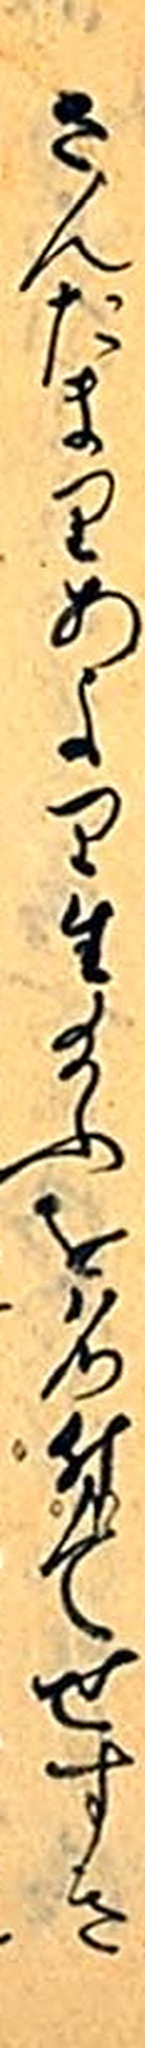さんたまりあより生給ふを名付てせすき
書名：ドチリナ・キリシタン
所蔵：東京大学総合図書館 / General Library in the University of Tokyo
